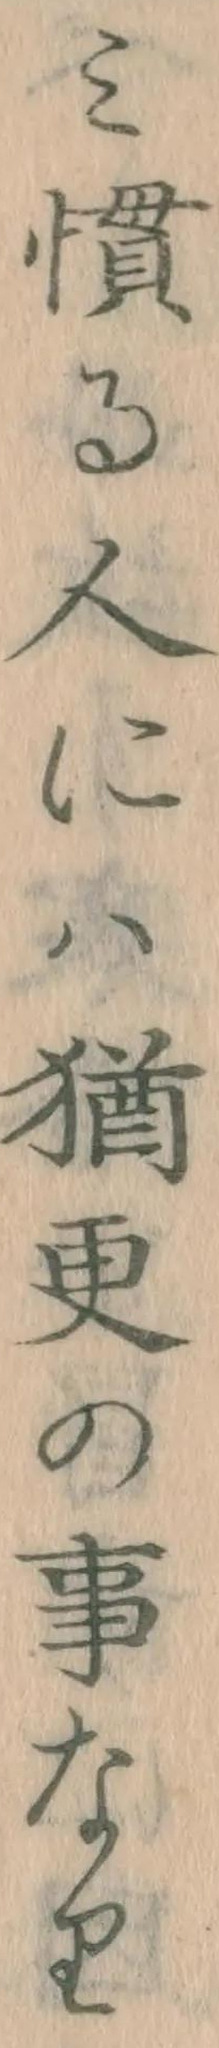み慣る人には猶更の事なり
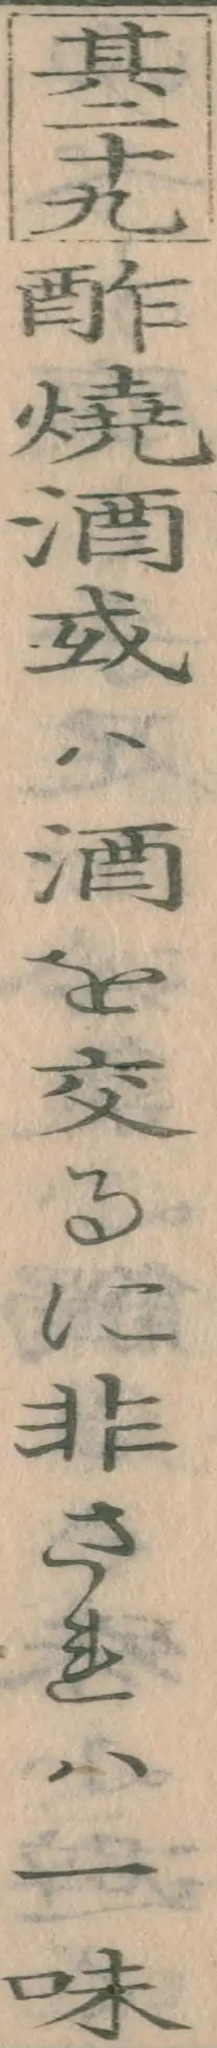其二十九酢、焼酒或は酒を交るに非されは一味
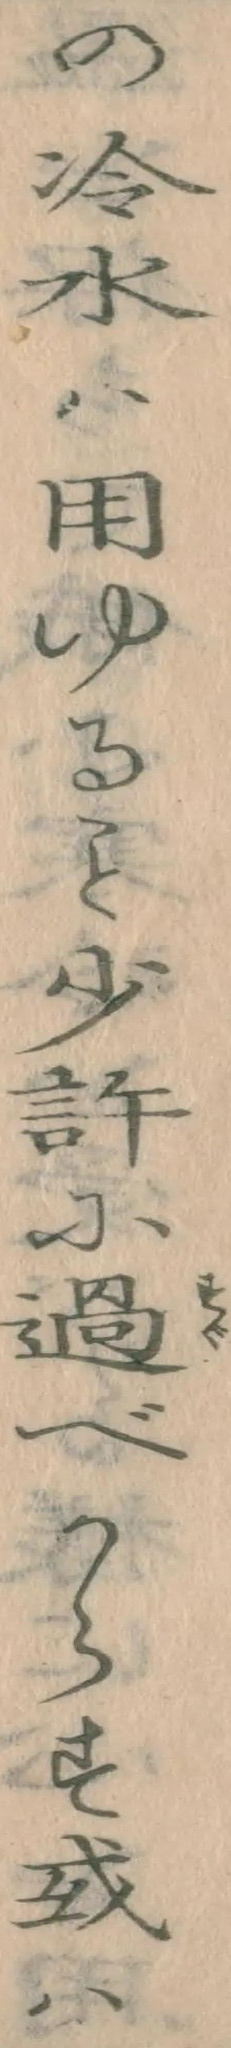の冷水は用ゆること少許に過べからす或は
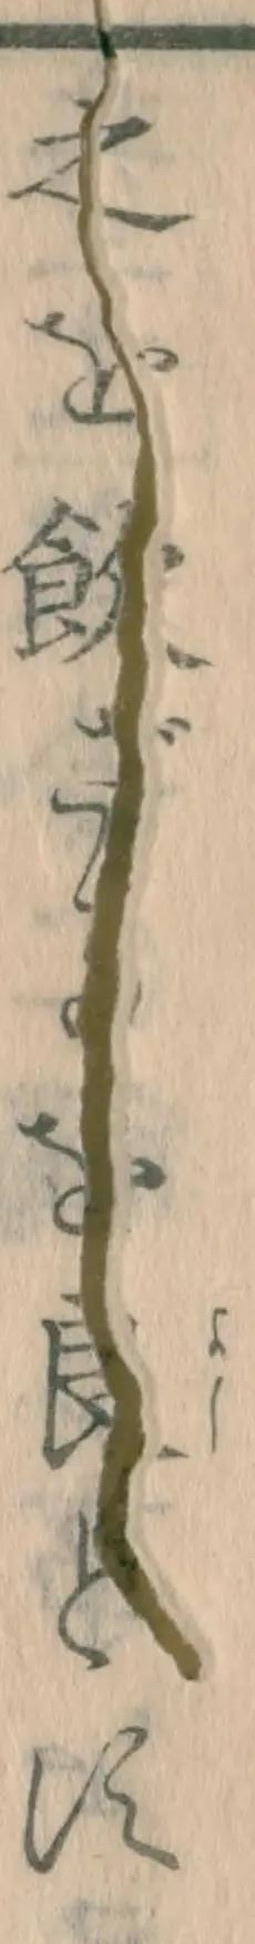之を飲ざるを良とす
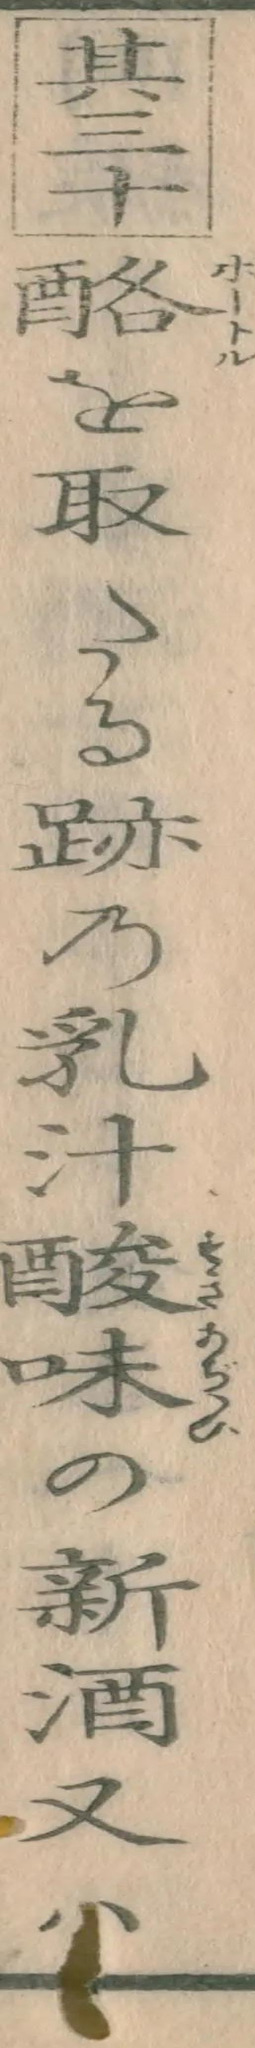其三十酪を取たる跡の乳汁酸味の新酒又は

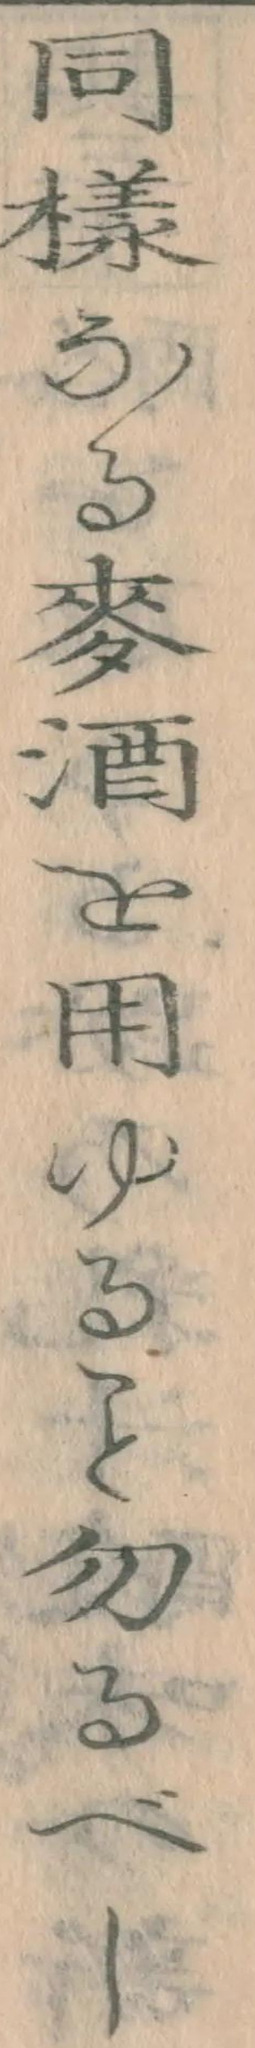同様なる麦酒を用ゆること勿るべし
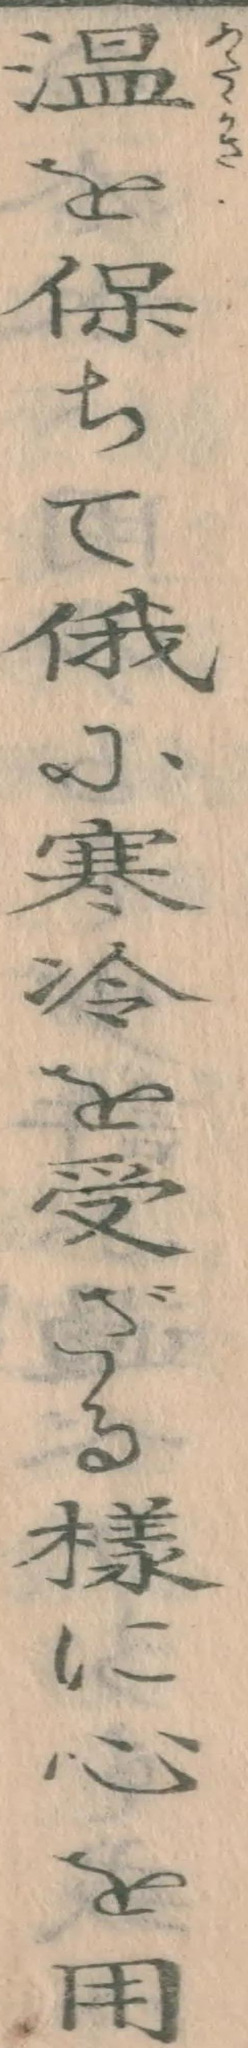温を保ちて俄に寒冷を受ざる様に心を用
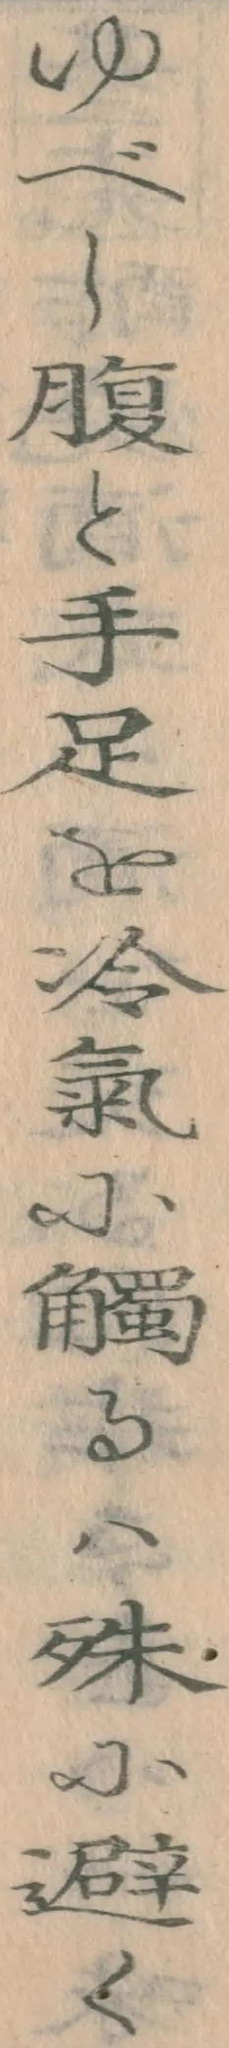ゆべし腹と手足を冷気に触るは殊に避く
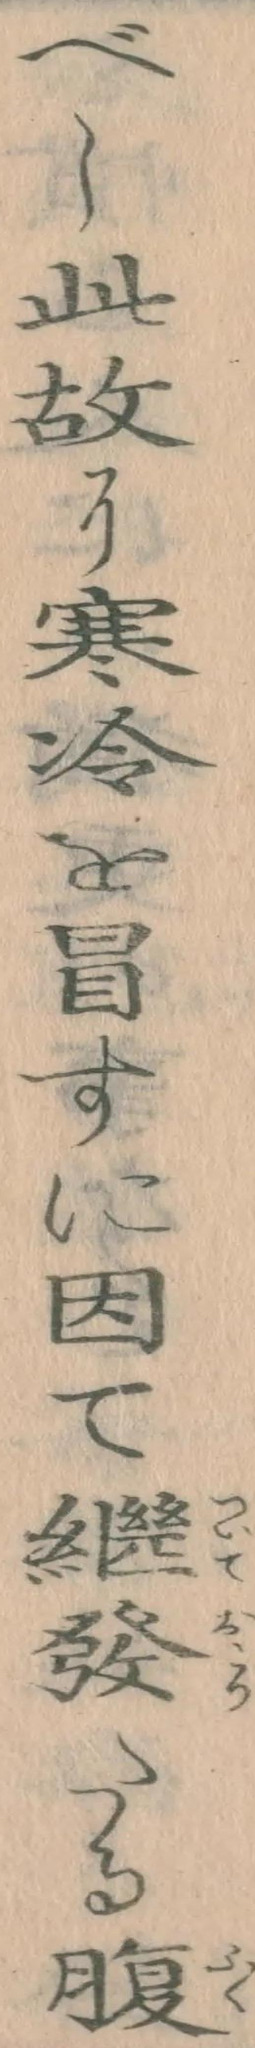べし此故に寒冷を冒すに因て継発たる腹
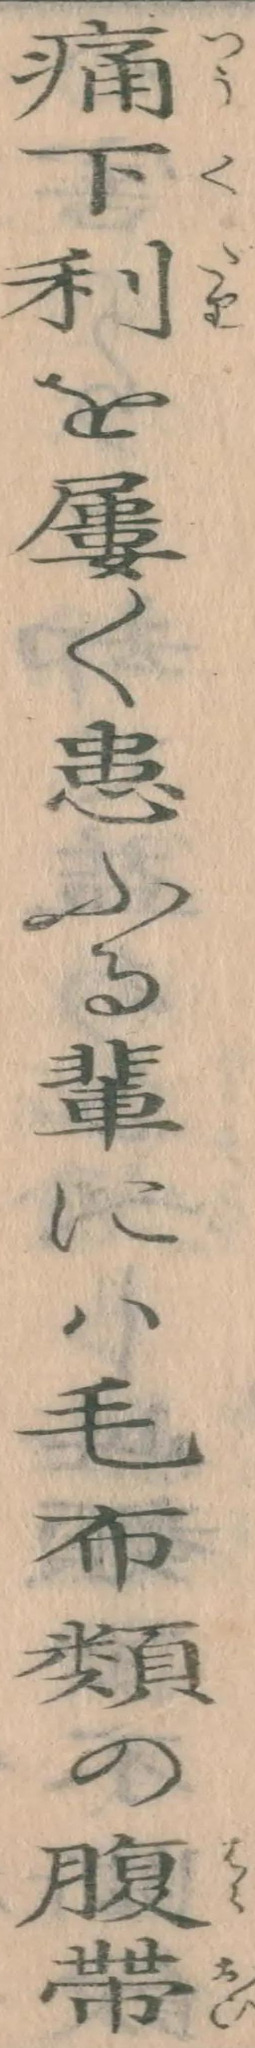痛下利を屢々患ふる輩には毛布類の腹帯
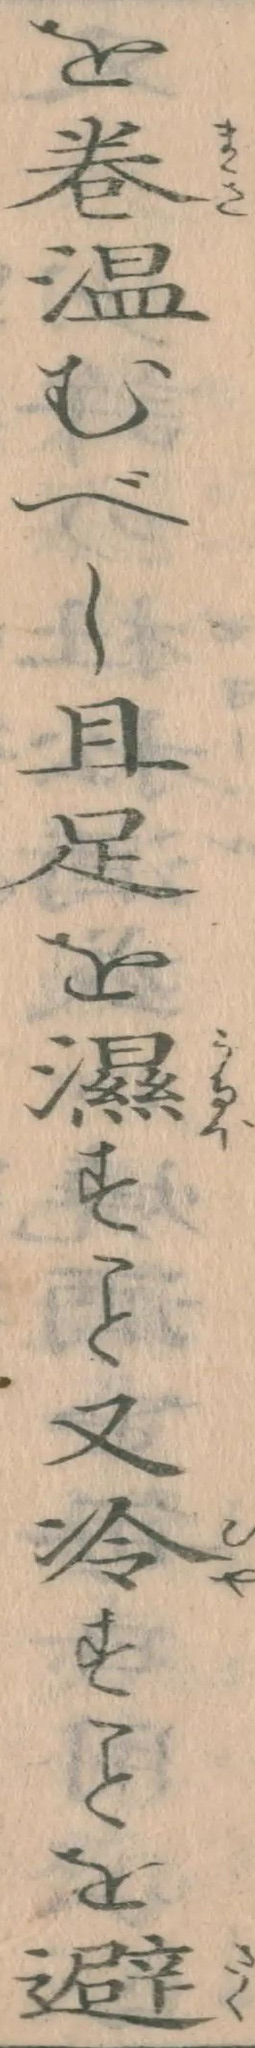を巻温むべし且足を湿すこと又冷すことを避
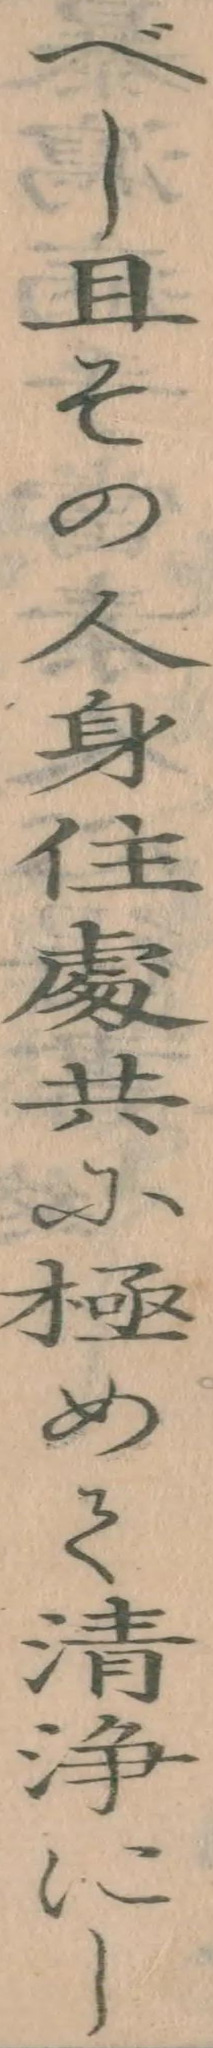べし且その人身住処共に極めて清浄にし
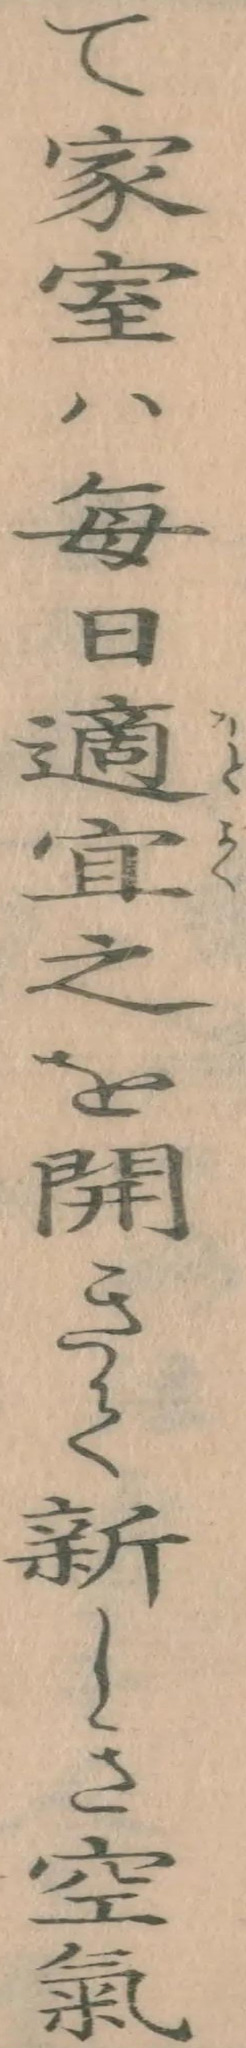て家室は毎日適宜之を開きて新しき空気
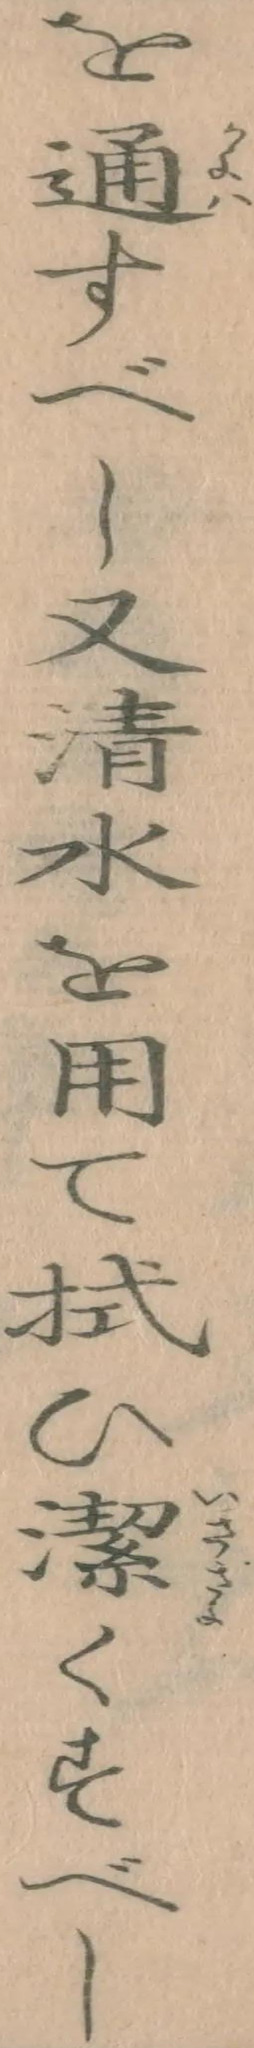を通すべし又清水を用て拭ひ潔くすべし
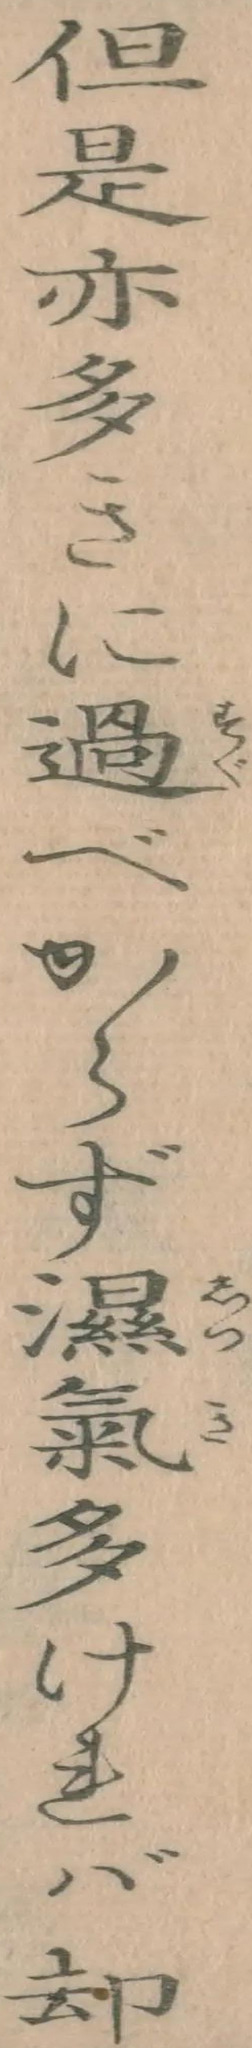但是亦多きに過べからず湿気多ければ却
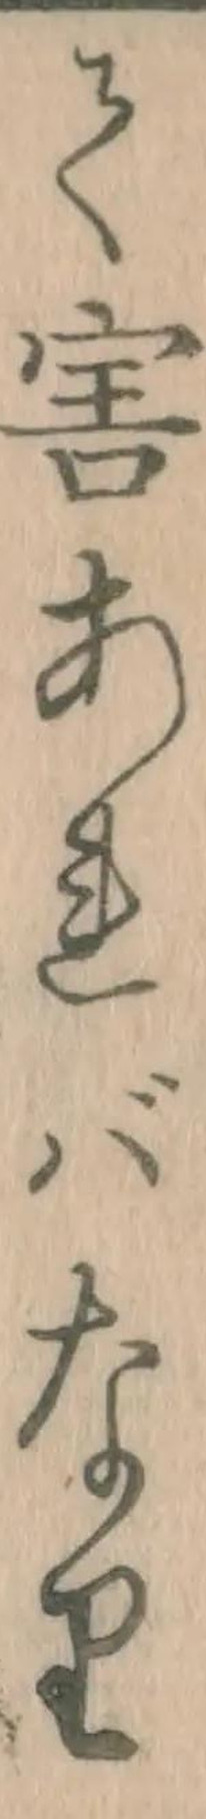て害あればなり
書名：暴瀉病手当素人心得書
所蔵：国立国会図書館 National Diet Library, JAPAN
